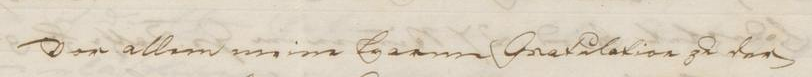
Vor allem meine warme Gratulation zu der
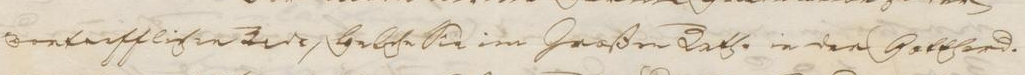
vortrefflichen Rede, welche Sie im Großen Rathe in der Gotthard -
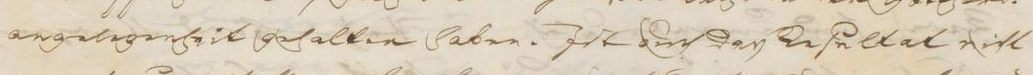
angelegenheit gehalten haben. Ist auch das Resultat nicht
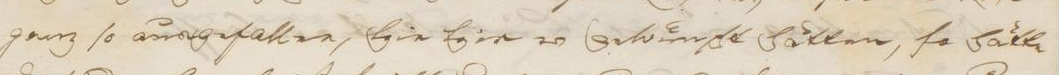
ganz so ausgefallen, wie wir es gewünscht hätten, so hätte
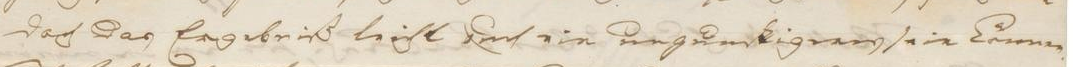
doch das Ergebniß leicht auch ein ungünstigeres sein können.
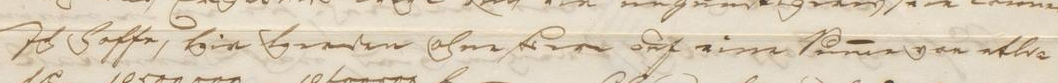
Ich hoffe, wir werden ohne Bern auf eine Summe von etwa
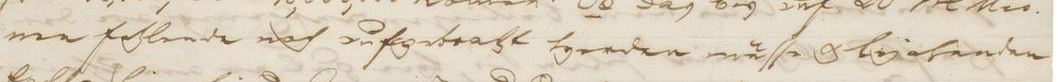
nen fehlende noch aufgebracht werden müsse & bejahenden
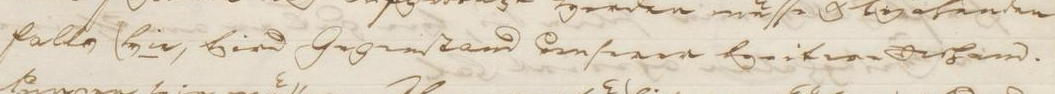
Falls wie, wird Gegenstand unserer weitern Verhand-
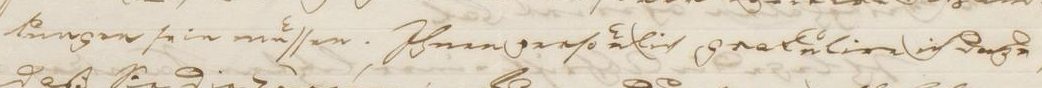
lungen sein müssen. Ihnen persönlich gratulire ich dazu,
